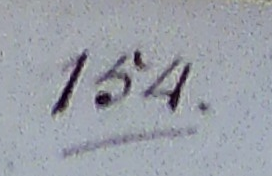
154.
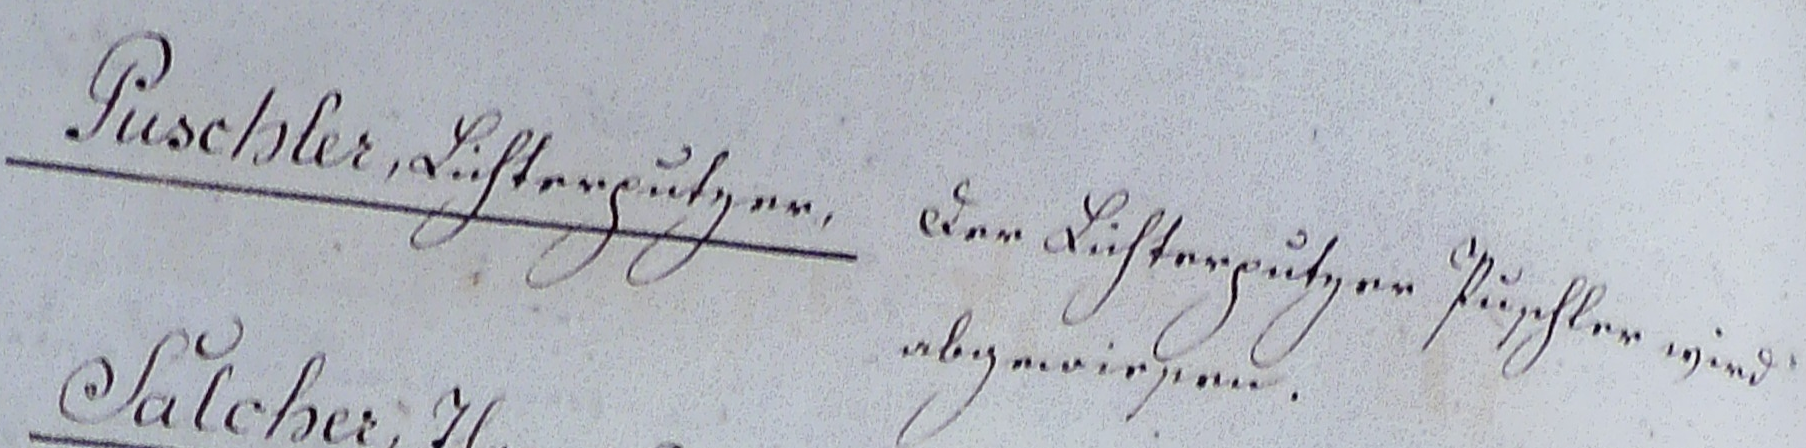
Puschler, Lichterputzer. Der Lichterputzer Puschler wird
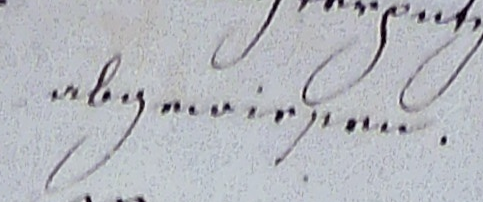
abgewiesen.
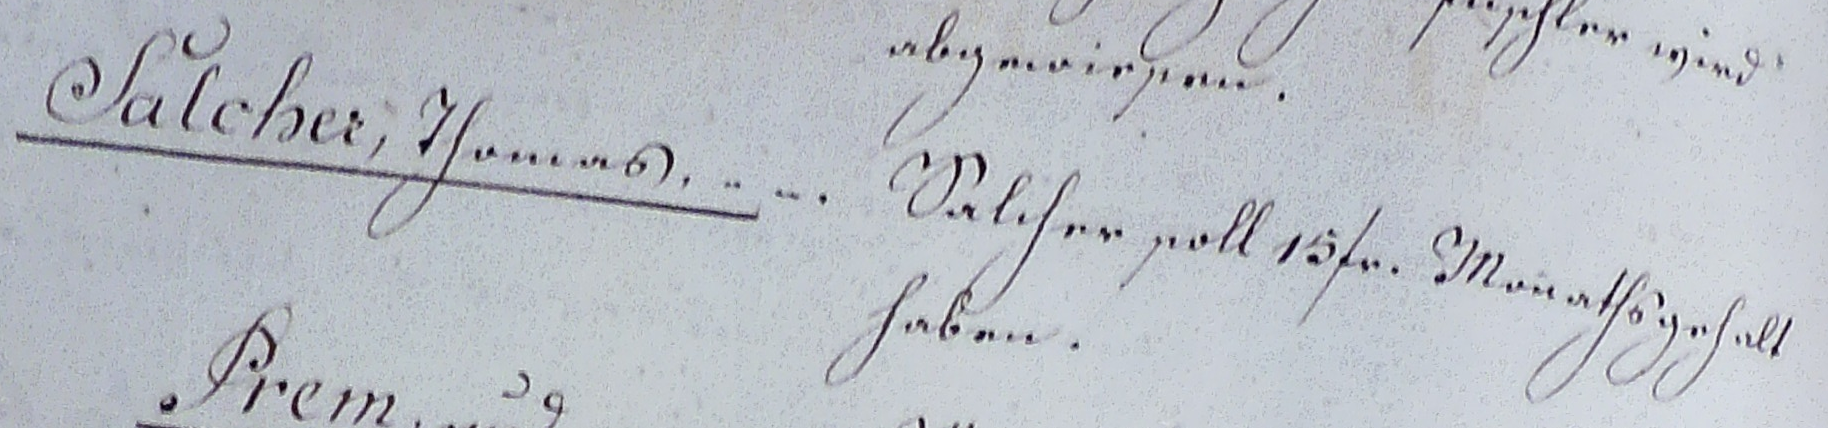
Salcher, Thomas. .. .. . Salcher soll 15fr. Monathsgehalt
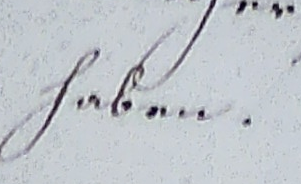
haben.
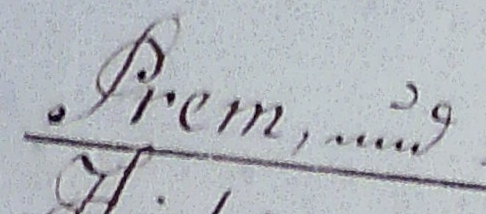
Prem, und
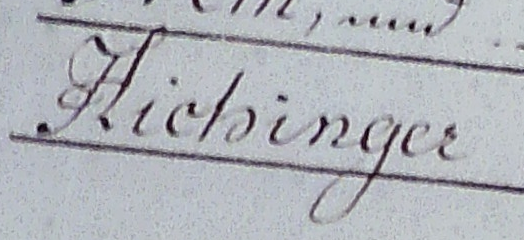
Aichinger.
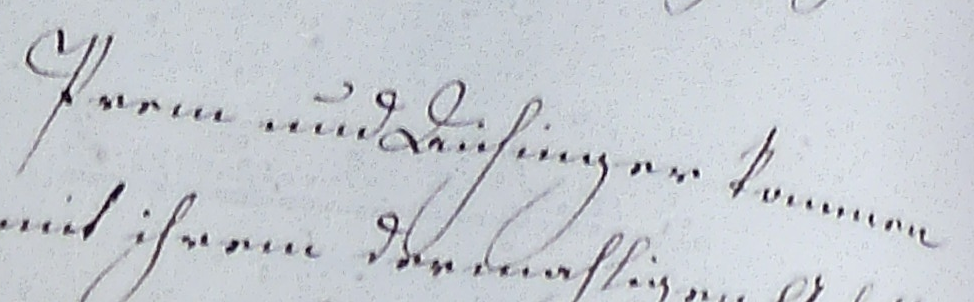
Prem, und Aichinger kommen
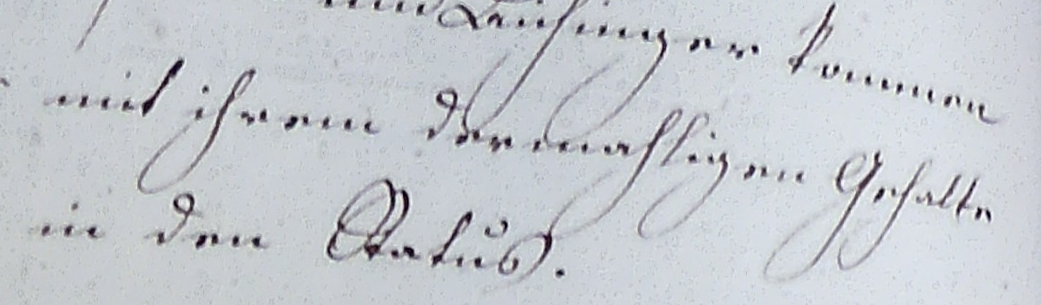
mit ihrem dermahligen Gehalte
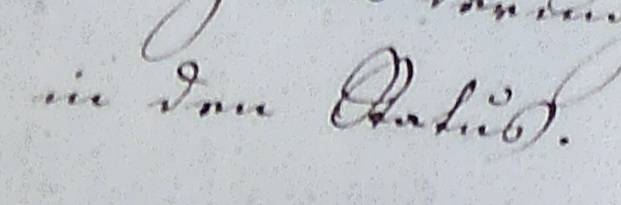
in den Satus.
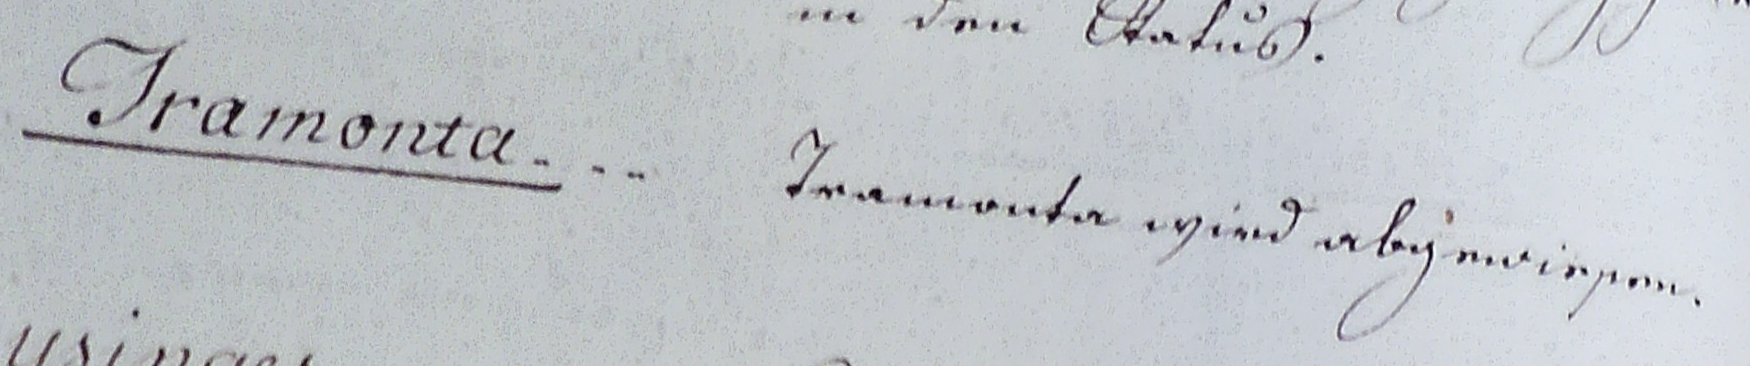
Tramonta .. . .. Tramonta wird abgewiesen.
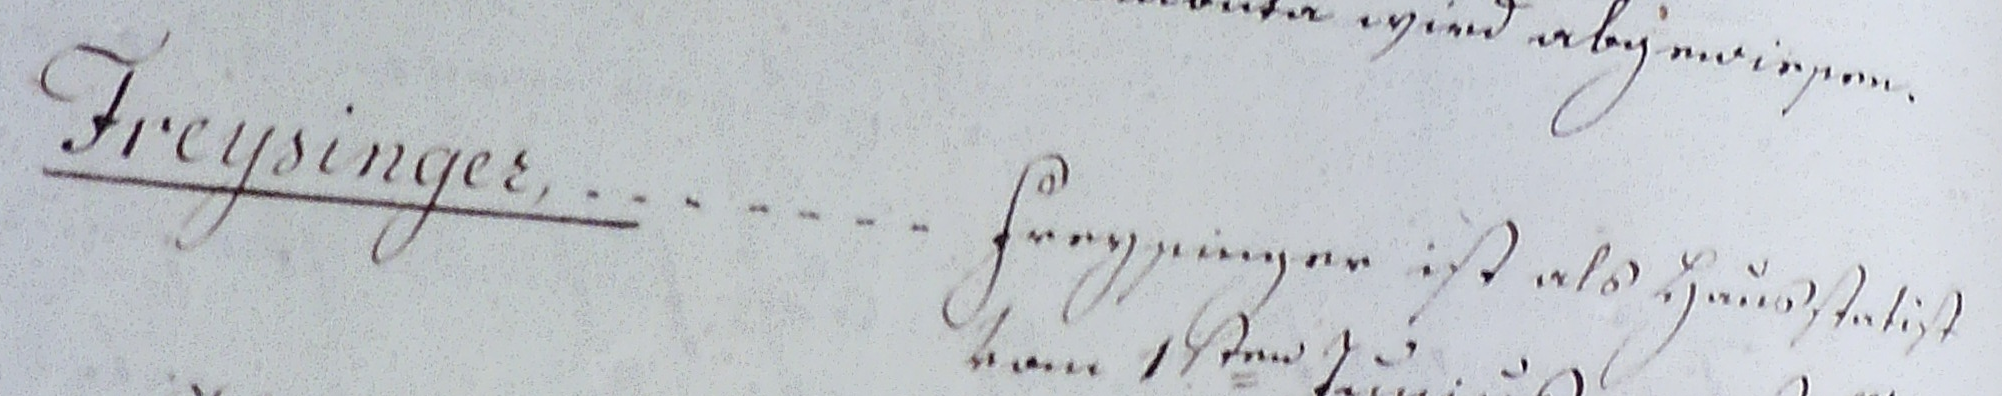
Freysinger, . . .. .. .. .. .. Freysinger ist als Hausstatist
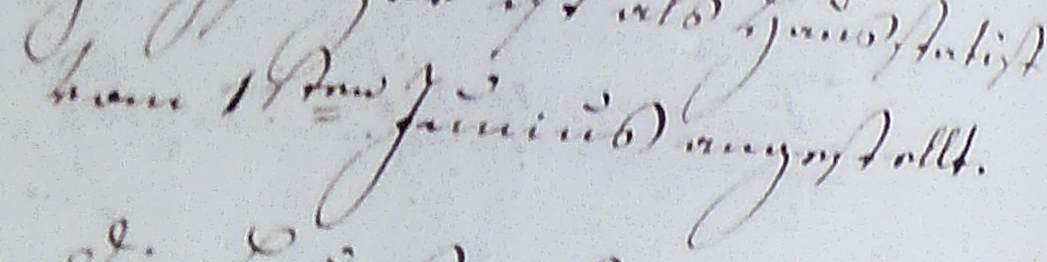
vom 1ste͇n Junius angestellt.
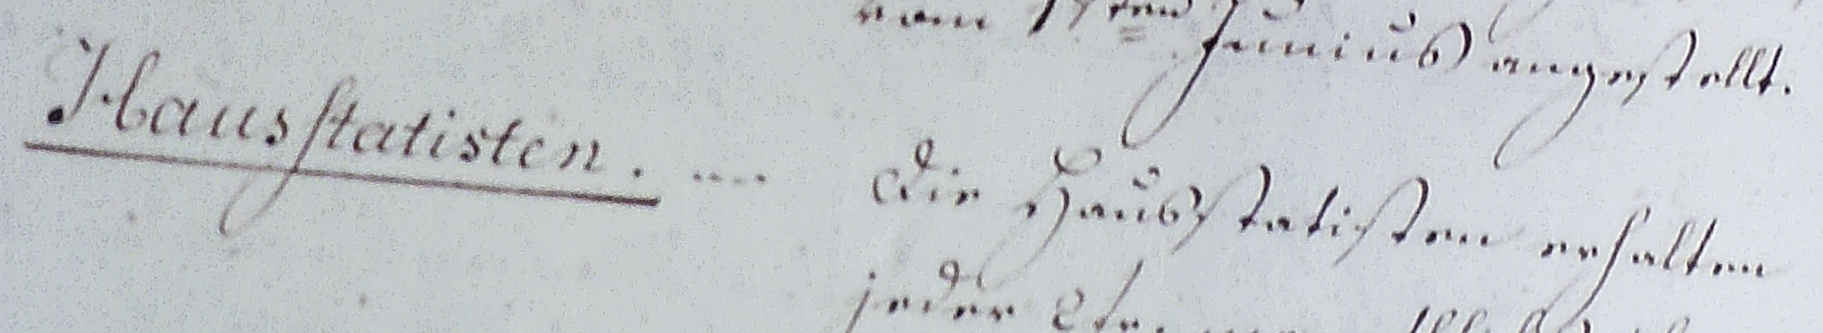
Hausstatisten . .. .. Die Hausstatisten erhalten
